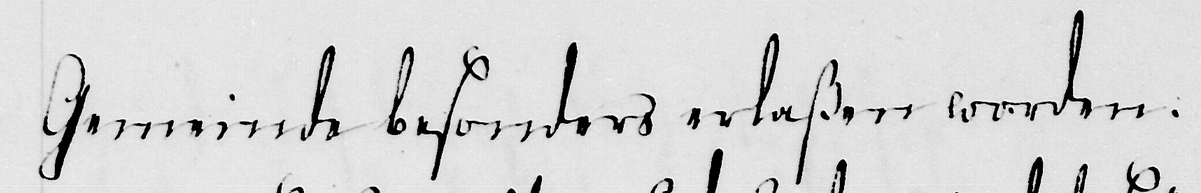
Gemeinde besonders erlaßen worden.
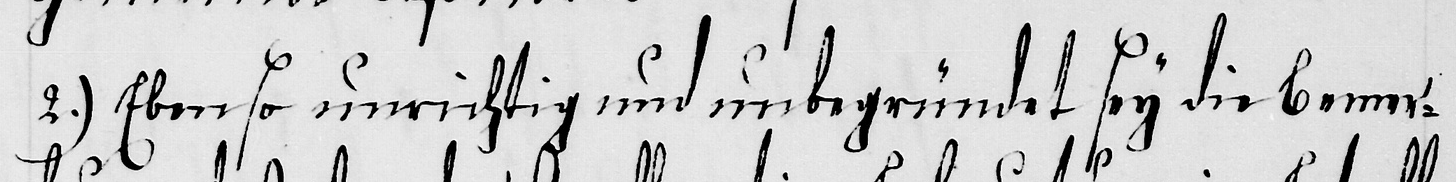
2.) Ebenso unrichtig und unbegründet sey die Bemer¬
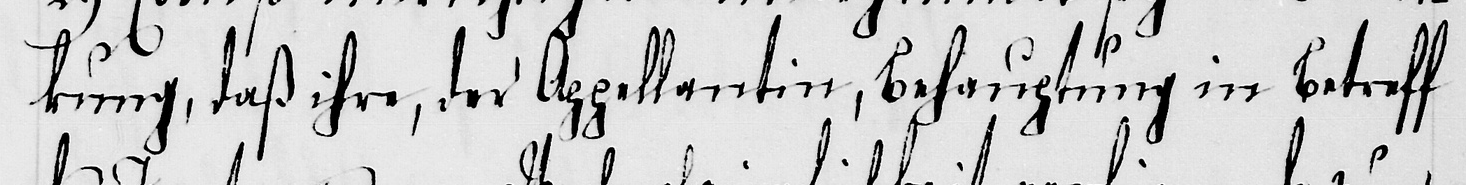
kung, daß ihre, der Appellantin, Behauptung in Betreff
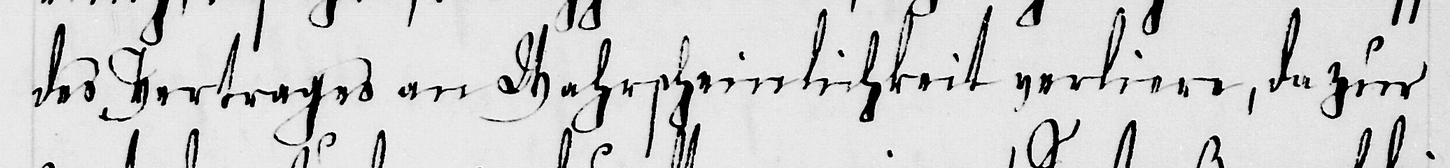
des Vertrages an Wahrscheinlichkeit verliere, da zur
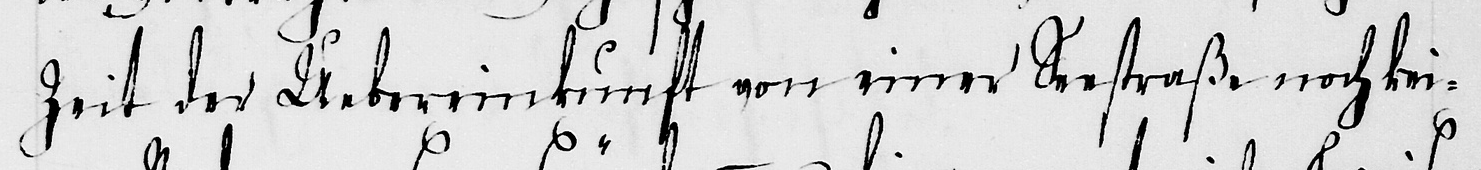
Zeit der Uebereinkunft von einer Seestraße noch kei¬
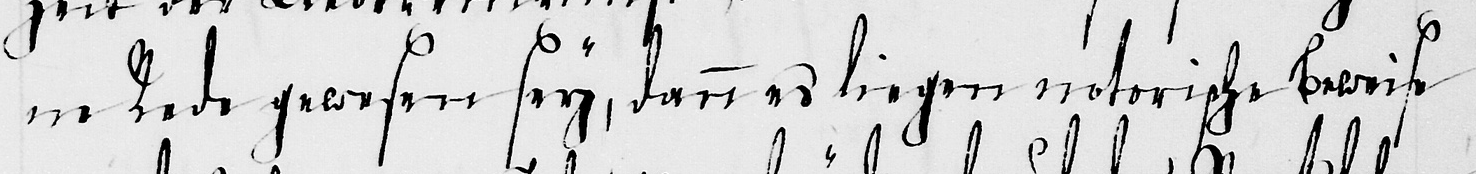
ne Rede gewesen sey, dann es liegen notorische Beweise
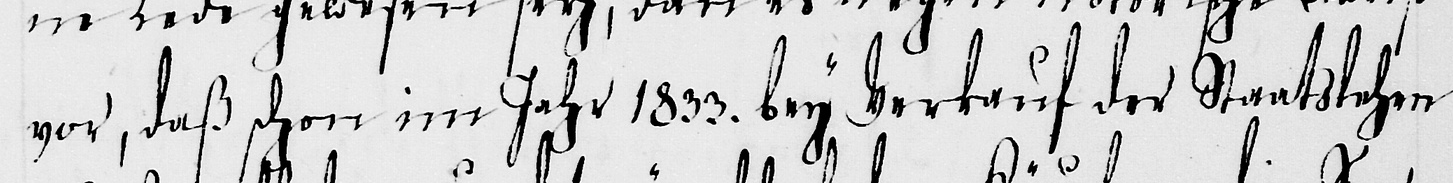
vor, daß schon im Jahr 1833. bey Verkauf der Staatslehen
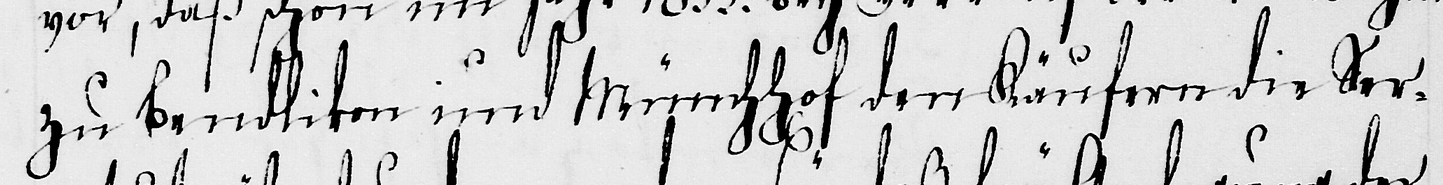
zu Bendlikon und Münchhof den Käufern die Ser¬
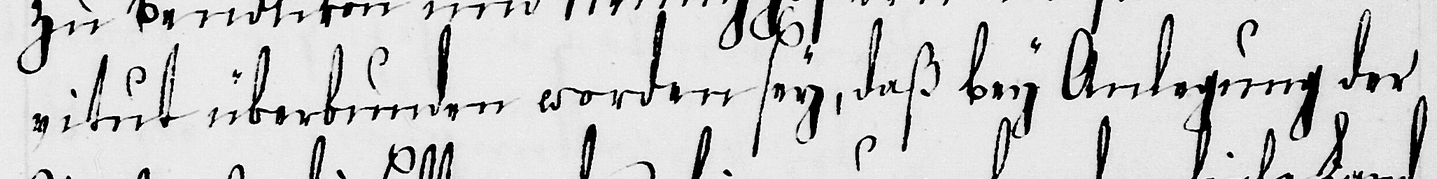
vitut überbunden worden sey, daß bey Anlegung der
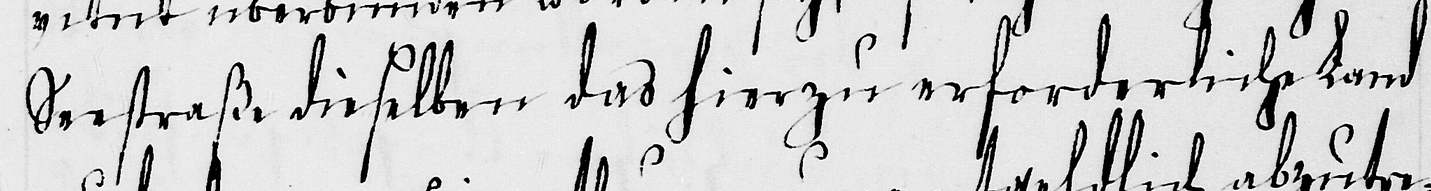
Seestraße dieselben das hierzu erforderliche Land
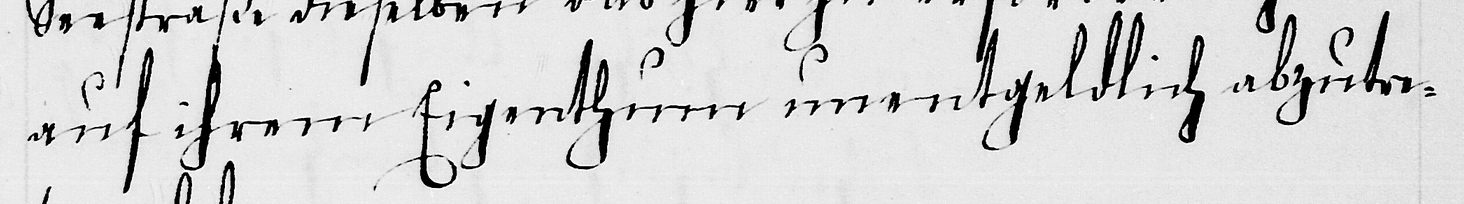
auf ihrem Eigenthum unentgeldlich abzutre¬
